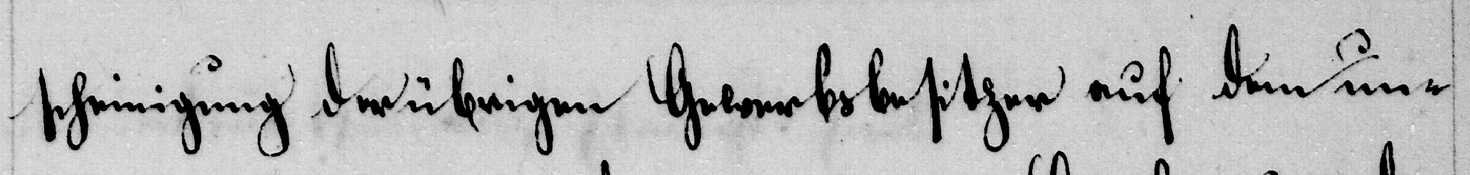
scheinigung der übrigen Gewerbsbesitzer auf dem un¬
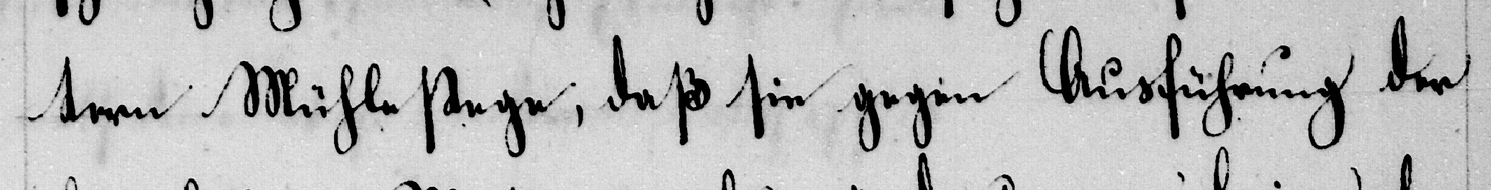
tern Mühlestege, daß sie gegen Ausführung der
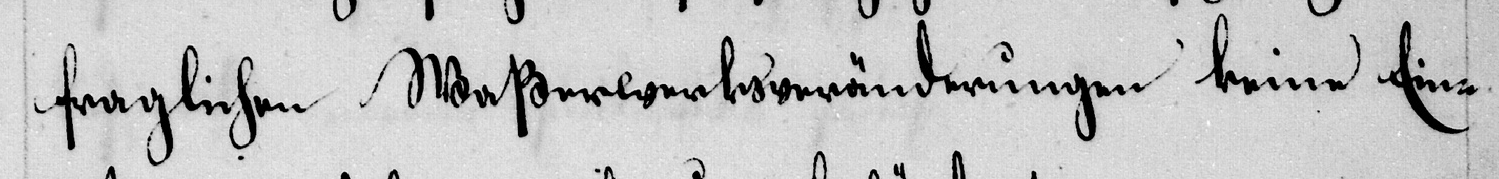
fraglichen Waßerwerksveränderungen keine Ein¬
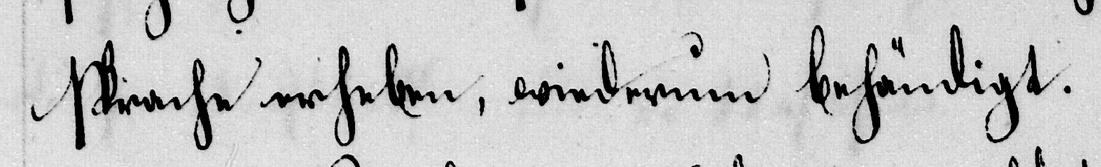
sprache erheben, wiederum behändigt.
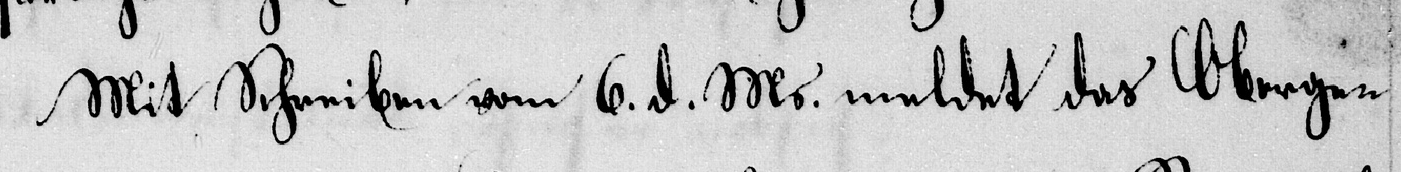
Mit Schreiben vom 6. d. Ms. meldet das Oberge¬
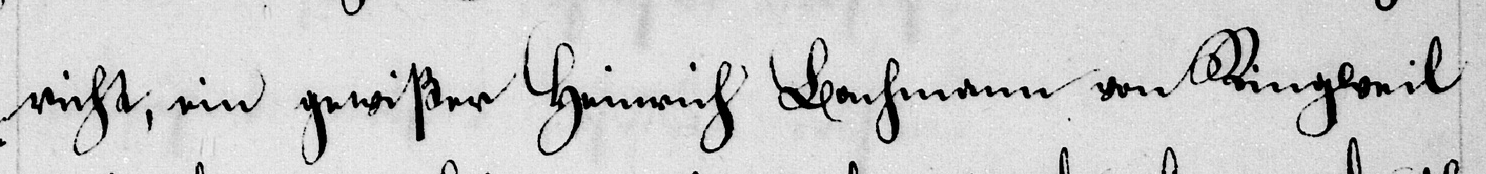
richt, ein gewißer Heinrich Bachmann von Ringweil
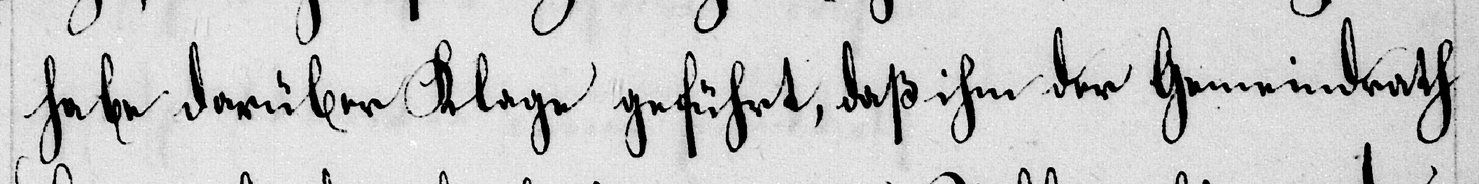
habe darüber Klage geführt, daß ihm der Gemeindrath
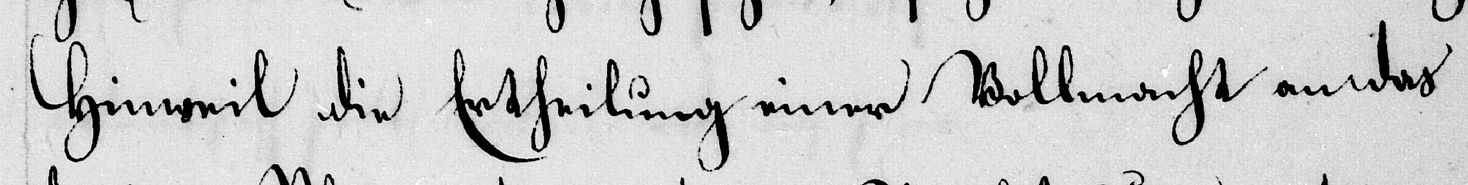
Hinweil die Ertheilung einer Vollmacht an das
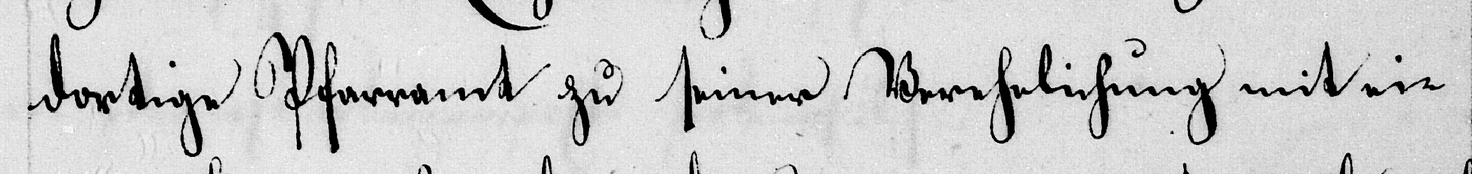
dortige Pfarramt zu seiner Verehelichung mit ei¬
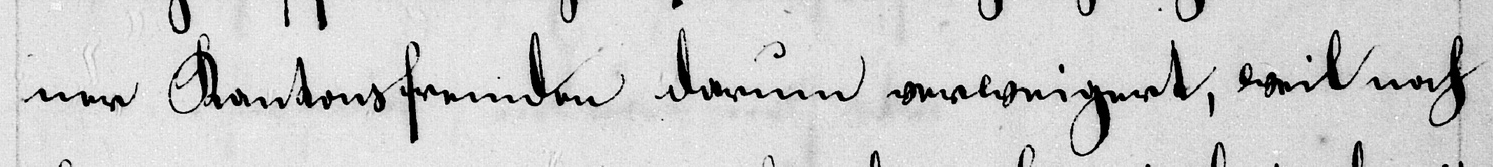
ner Kantonsfremden darum verweigert, weil noch
